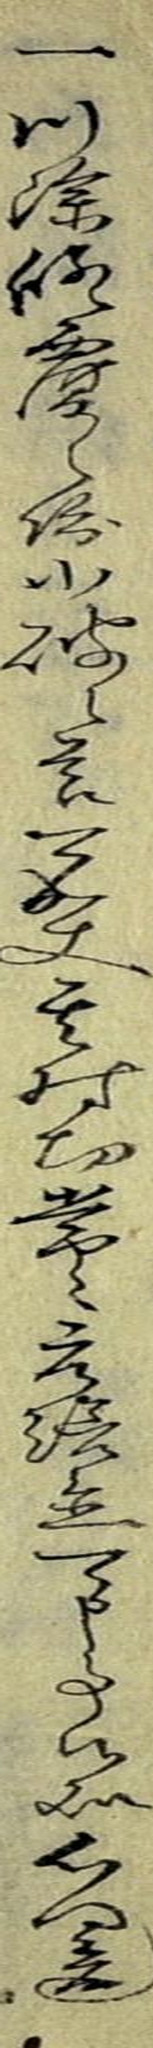一川除修覆之儀小破之節可成丈其村切常々取繕置可申事候処心得違
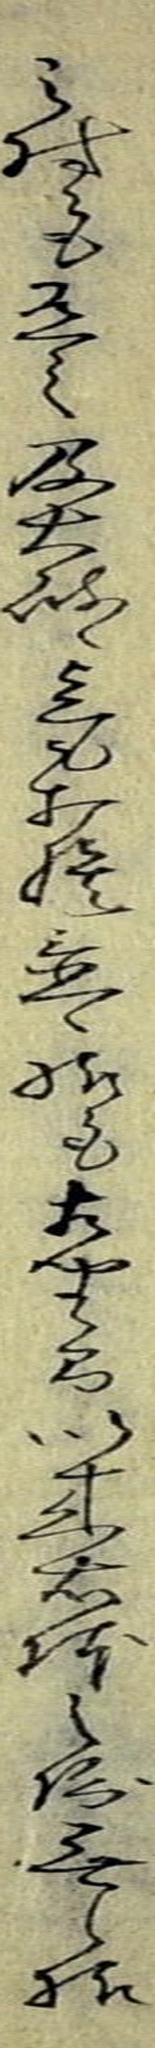之村々も有之及大破候迄も打捨置候様ニも相聞候間以来右体之儀無之様
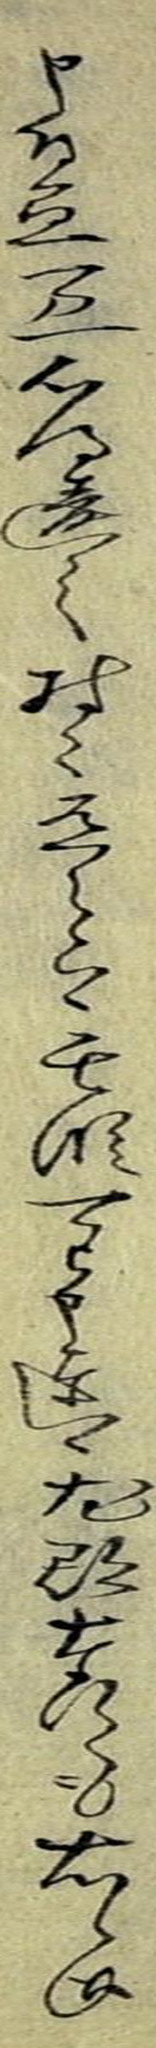申付宜万一心得違之村々有之候ハヽ其段可被申達候尤郡奉行へも右之趣
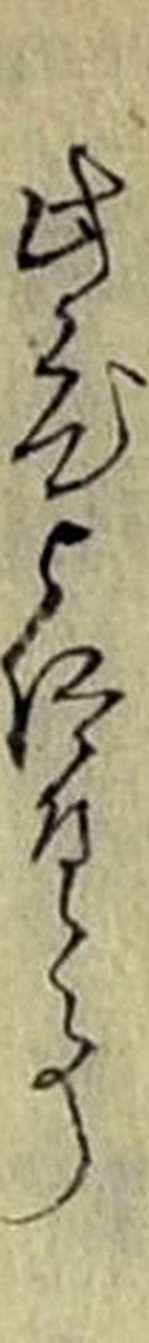此度被仰付候事
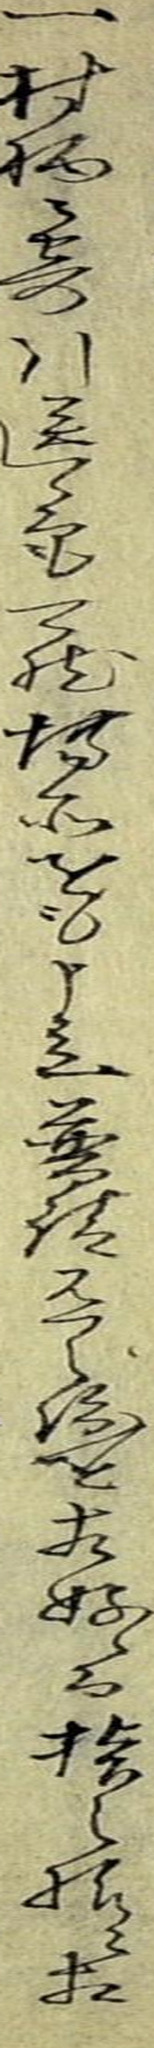一村柄ニ寄引送候而も可然場所をも申立普請有之儀を相好候而挊候様ニ相
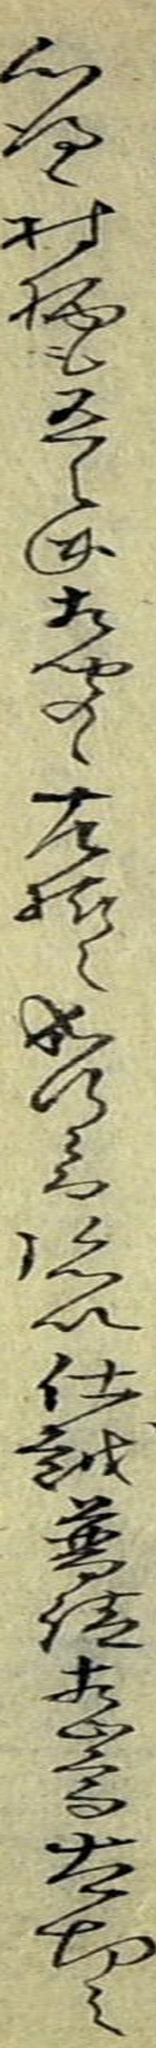心得候村柄も有之趣相聞候左様之成行ニ而跡以仕越普請相嵩太切之
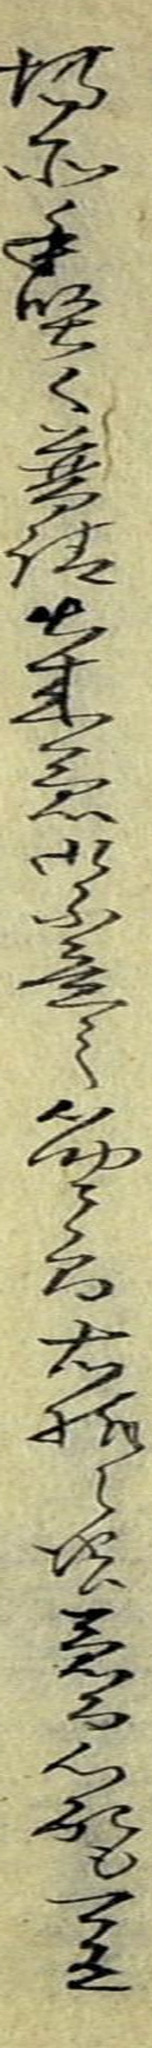場所手堅く普請出来兼御不益之筋ニ候間右様之儀ハ兼而心配も可有
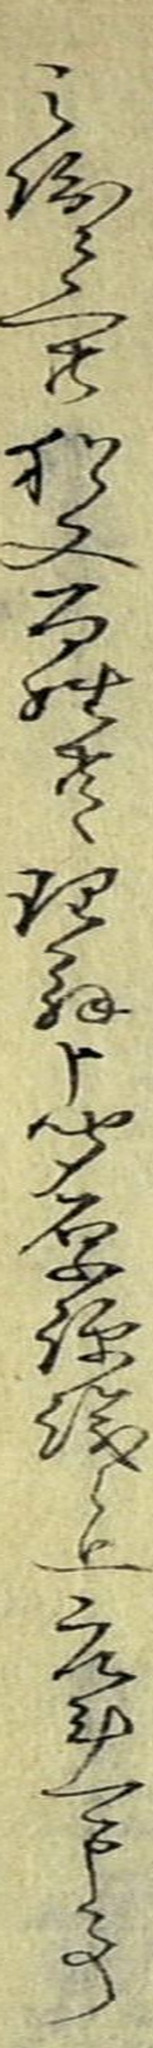之儀ニ候へ共猶又百姓共へ理解申聞厚評議之上取計可申事
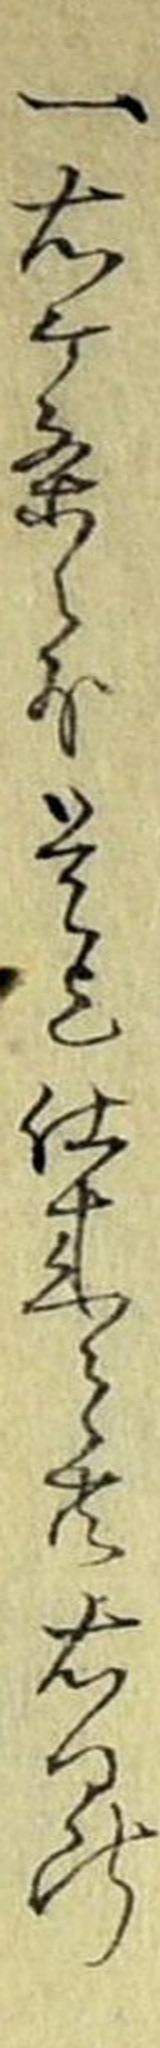一右ケ条之外是迄仕来ニ候共右同断
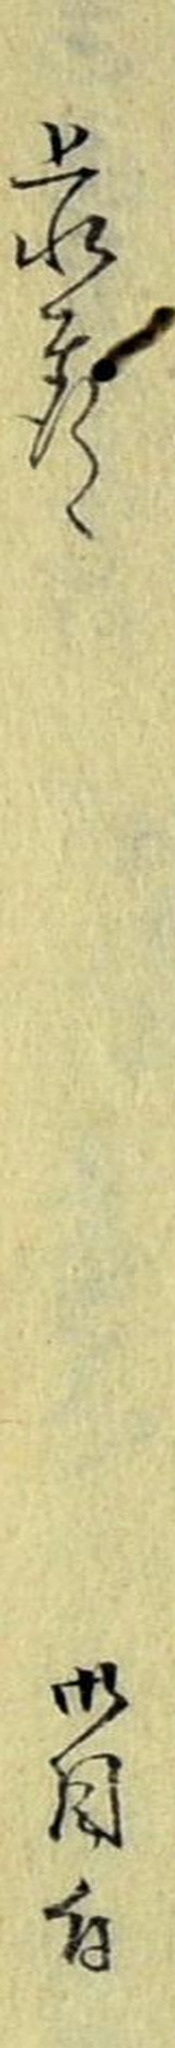上水奉行へ御目付
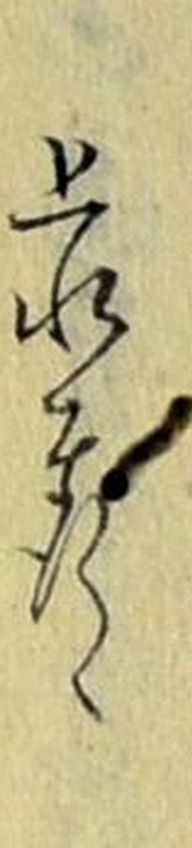用水奉行へ

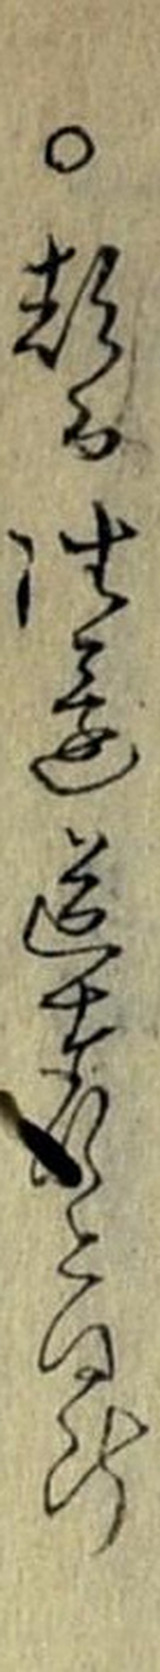○都而往還道奉行と同断
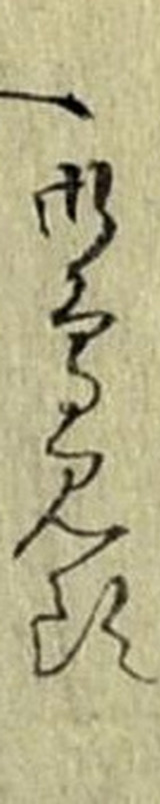御鳥見頭
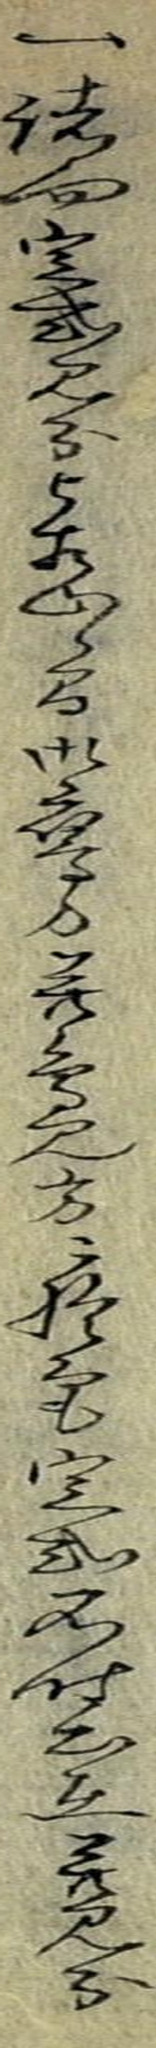一諸向定式見分被相止候間御鷹方并鳥見方ニ於而も定式不時出在并見分
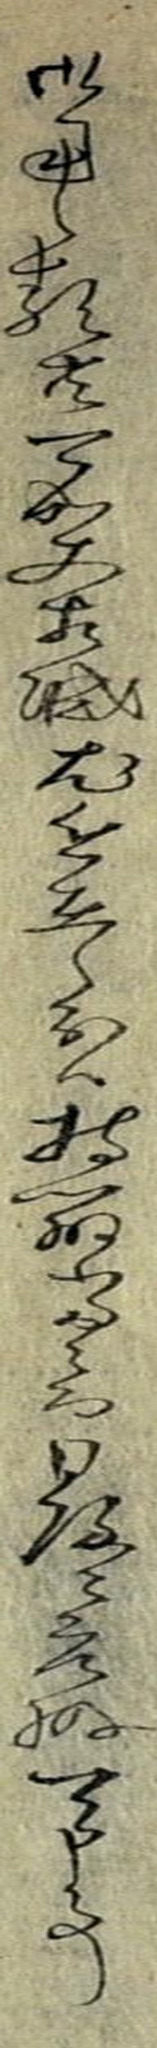御用之類共可成丈相減尤近在之分ハ持弁当ニ而日帰ニ取扱可申事
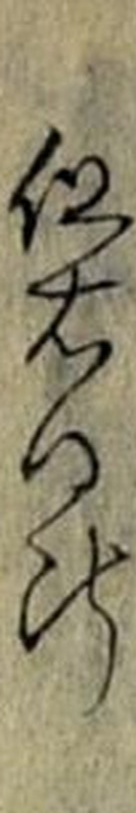但右同断
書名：命令之部 五
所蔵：福井県文書館 Fukui Prefectural Archives
